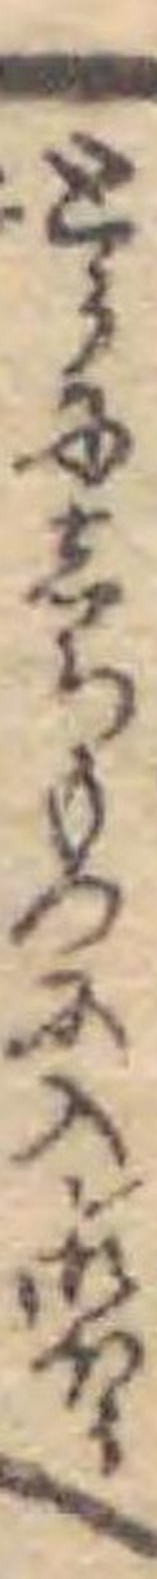とうにしちもつに入レ御ほう
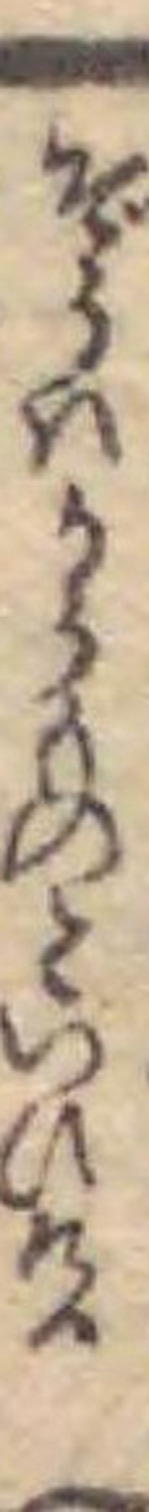ぞうはからものといひける
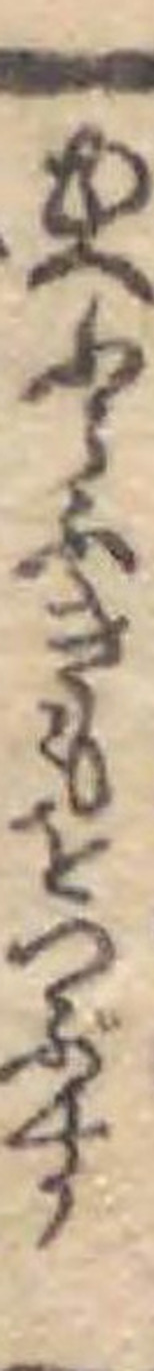ゆへふうふきもをつぶす
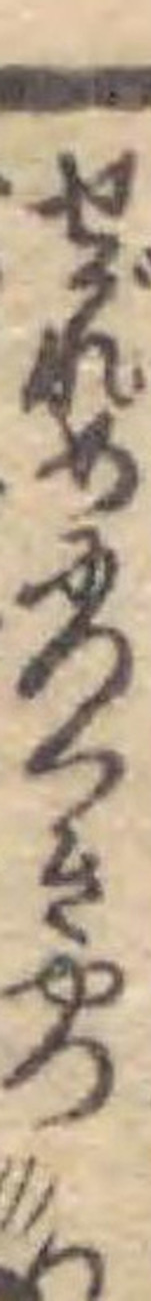せがれめにつくきやつ
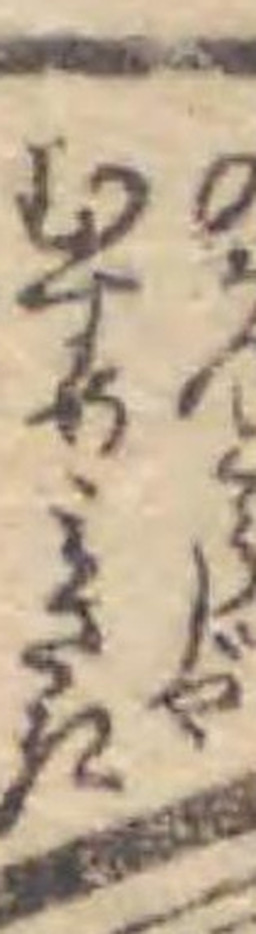むすめみさき
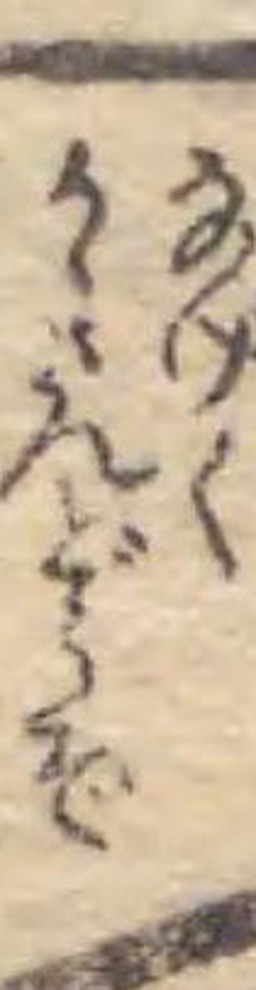かゝさんどうぞ
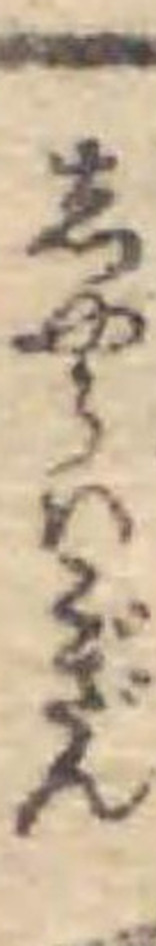しやうはござん
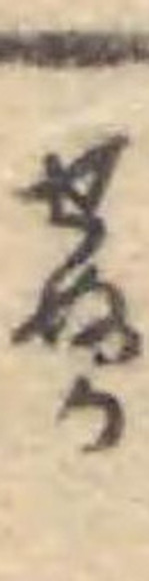せぬか
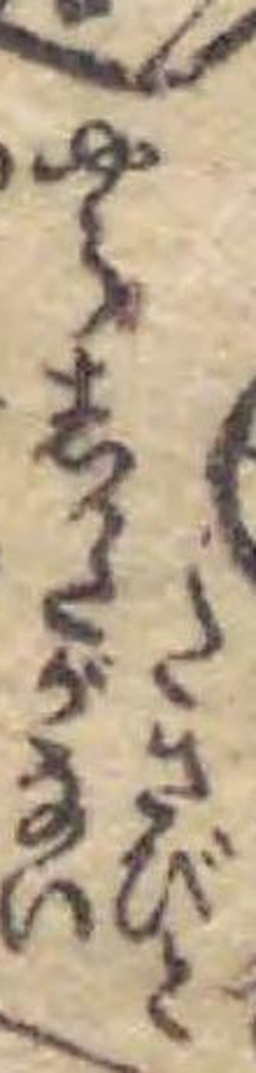やらしかたがない
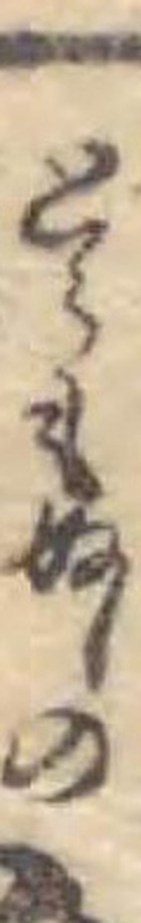とうもぬしの
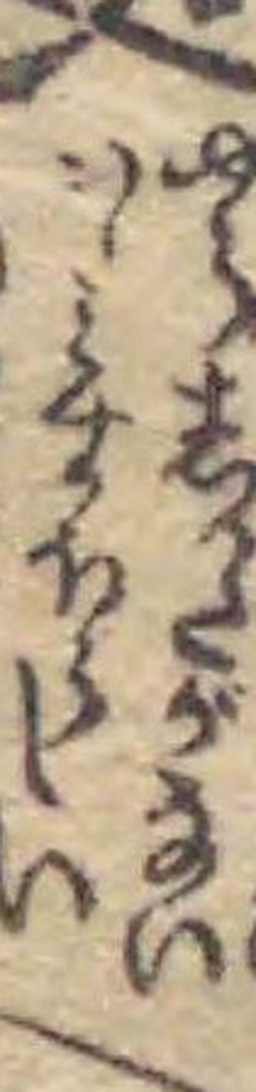もしみすほらしい
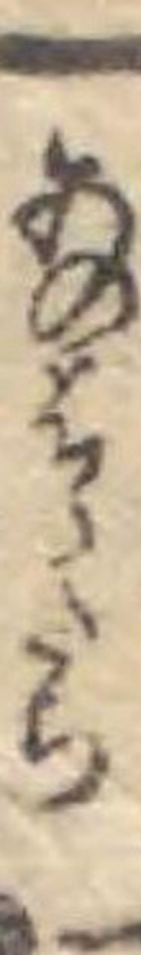あのはらたち
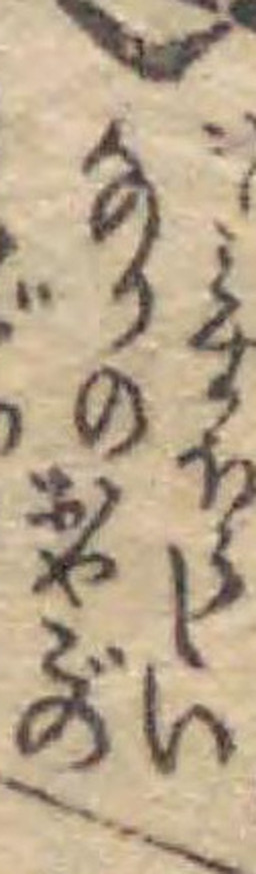なりのおやごの
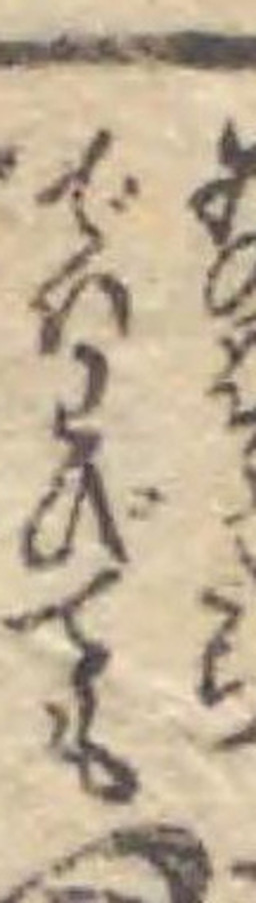ではわびても
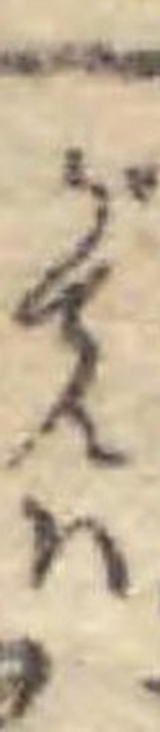がてんは
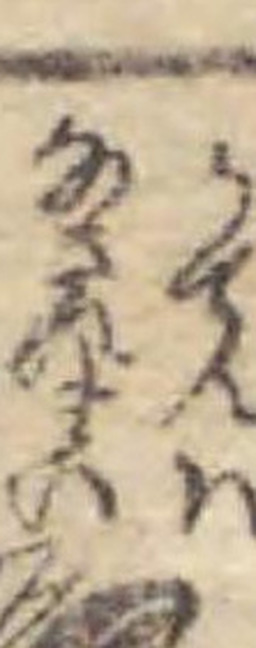なされまい
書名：扨化狐通人 : 2巻
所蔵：国立国会図書館 National Diet Library, JAPAN
